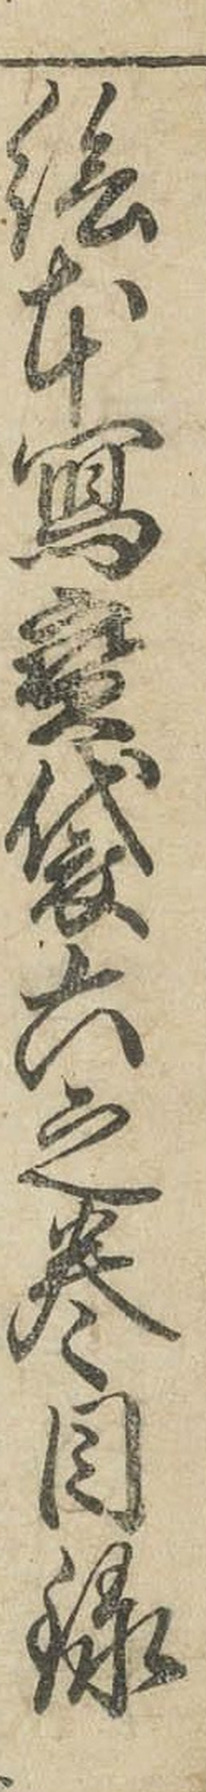絵本写宝袋六之巻目録
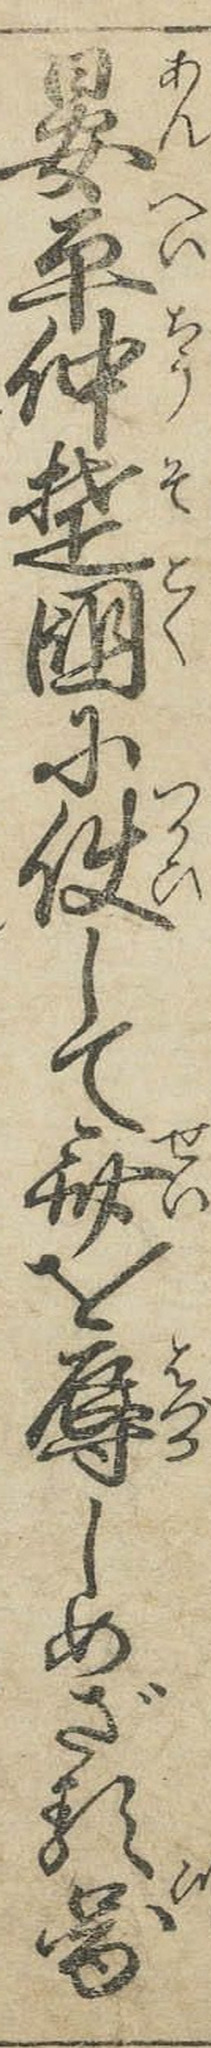晏平仲楚国に使して斉を辱しめざる図
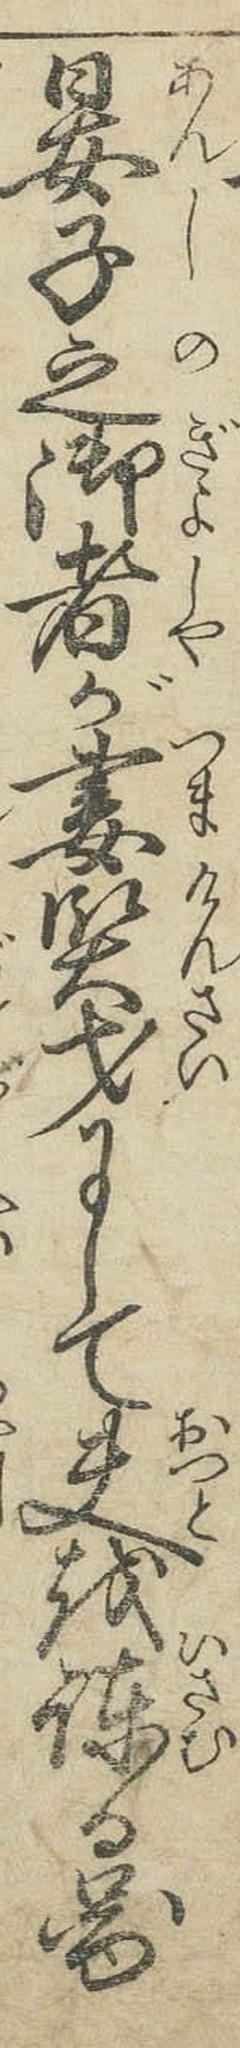晏子之御者が妻賢才にして夫を諫る図
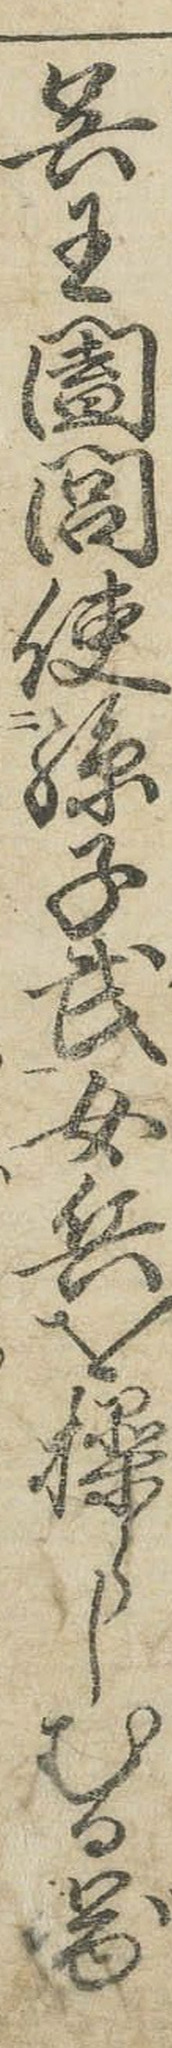呉王闔閭使孫氏武女兵を操らしむる図
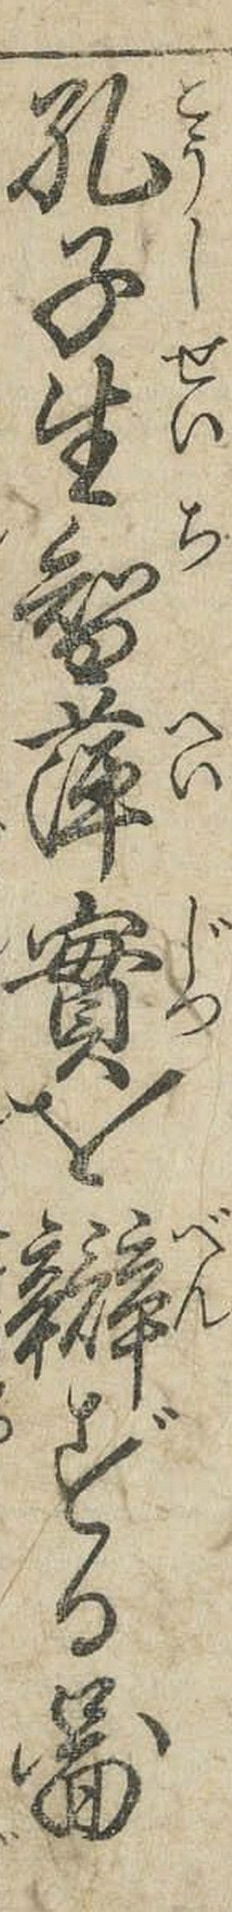孔子生智萍実を弁ずる図

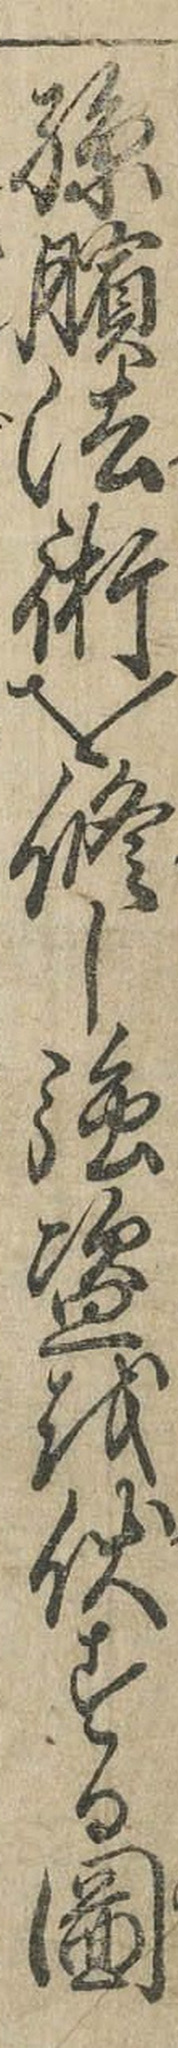孫臏法術を修し強盗を伏する図
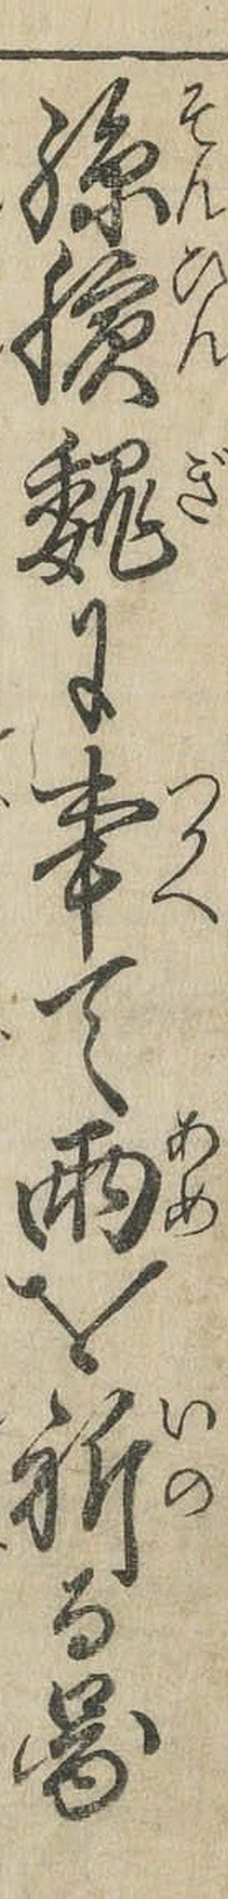孫臏魏に事て雨を祈る図
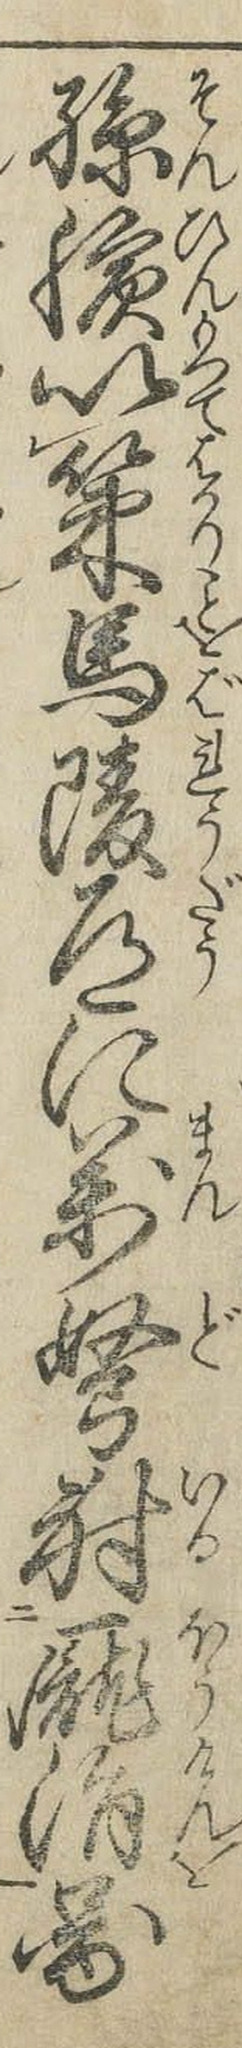孫臏以策馬陵道に万弩射龐涓図
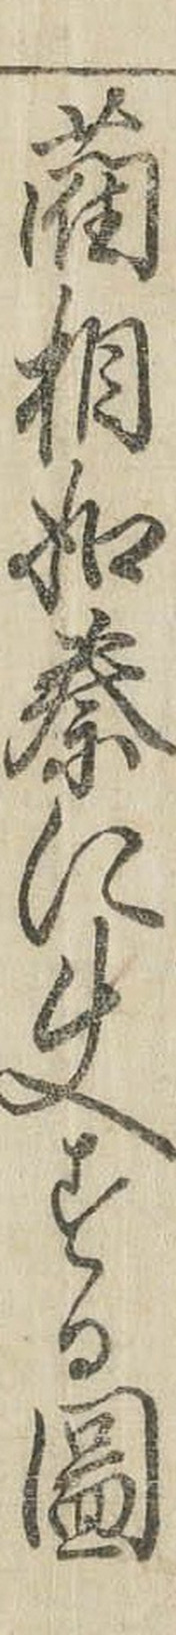藺相如秦に使する図
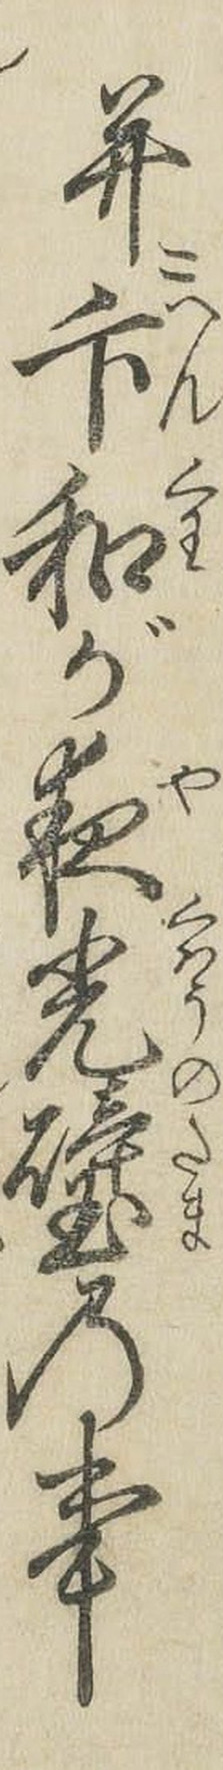并卞和が夜光璧の事
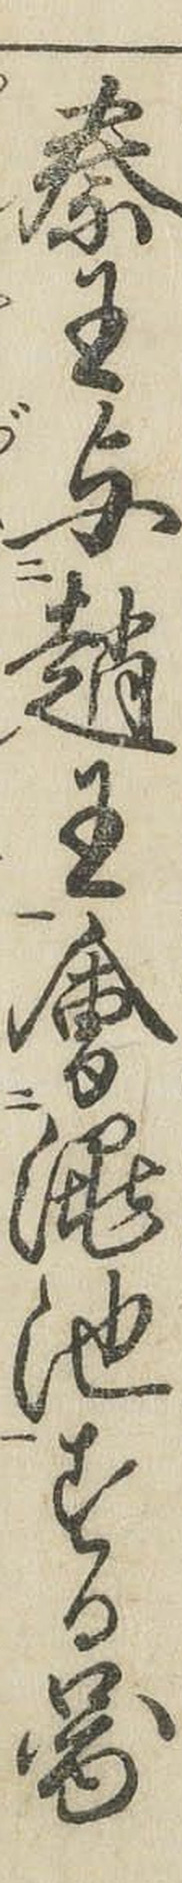秦王与趙王会澠池する図
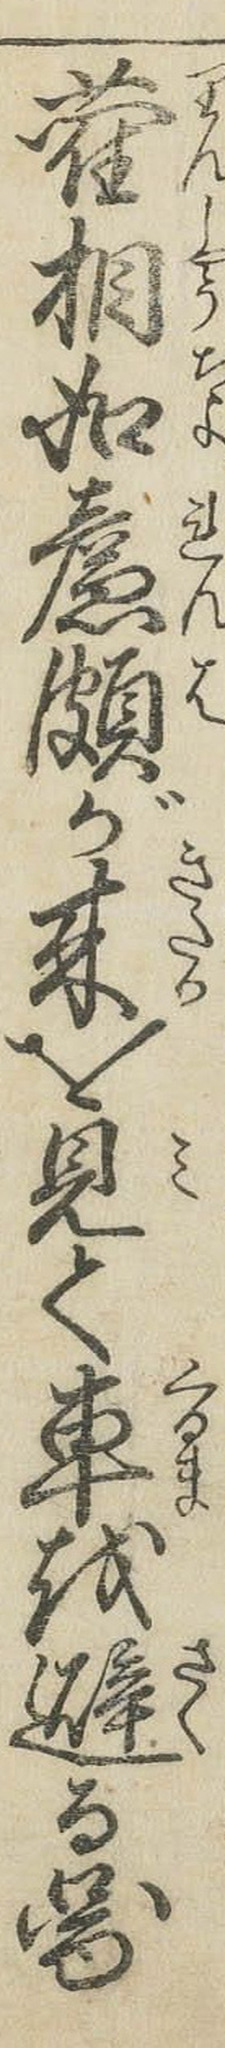藺相如廉頗が来を見て車を避る図
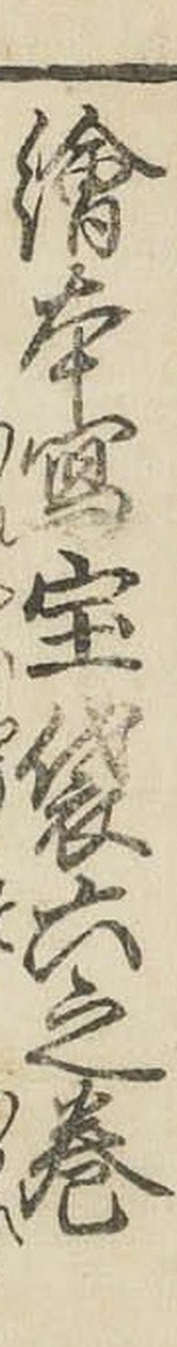絵本写宝袋六之巻
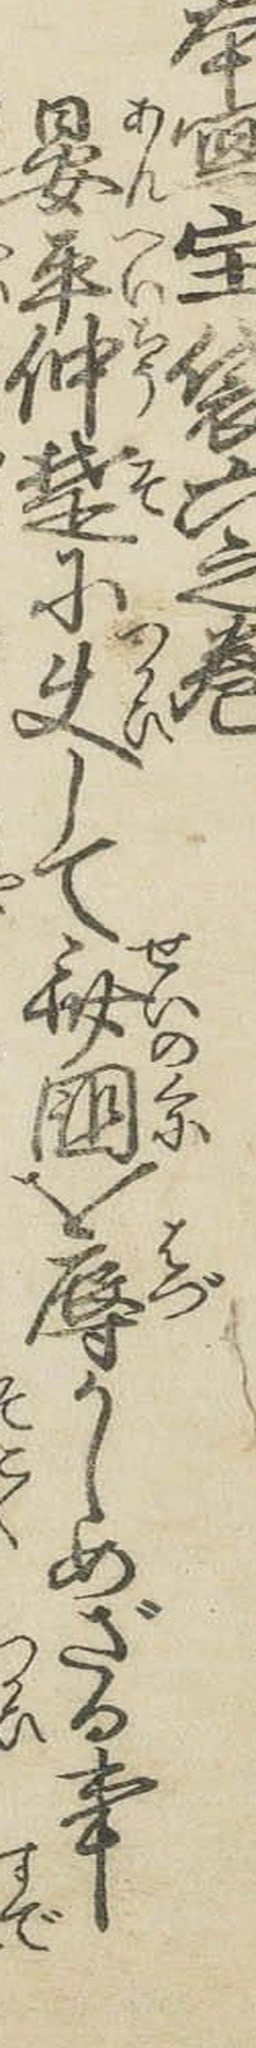晏平仲楚に使して斉国を辱かしめざる事
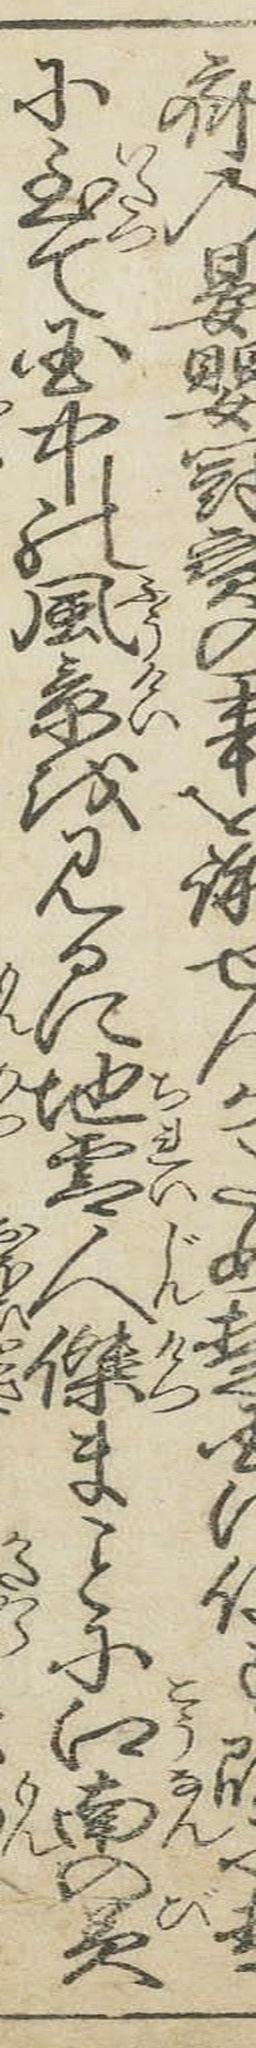に至て国中の風景を見るに地霊人傑まことに江南の美
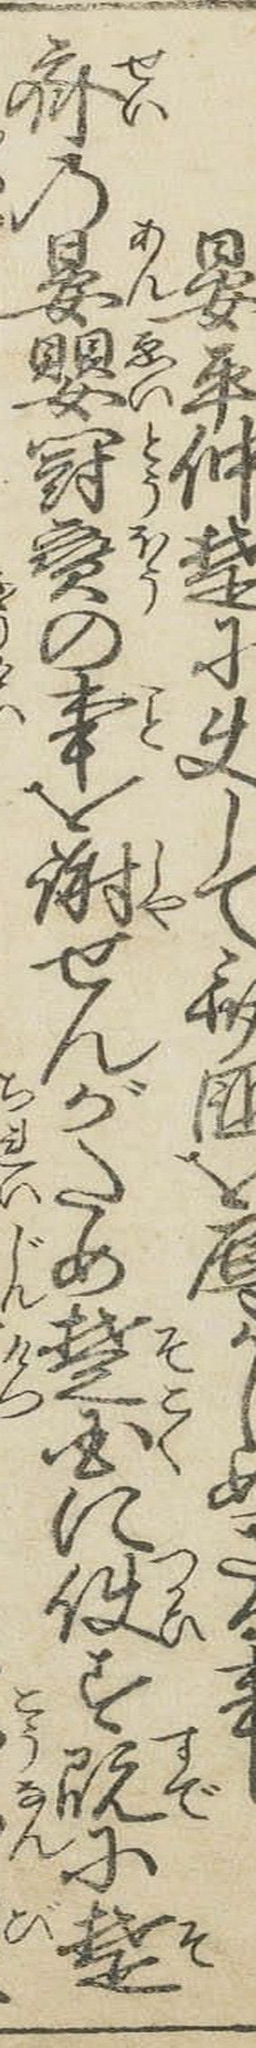斉の晏嬰闘宝の事を謝せんがため楚国に使す既に楚
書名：絵本写宝袋 9巻 6之巻
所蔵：東京学芸大学教育コンテンツアーカイブ
